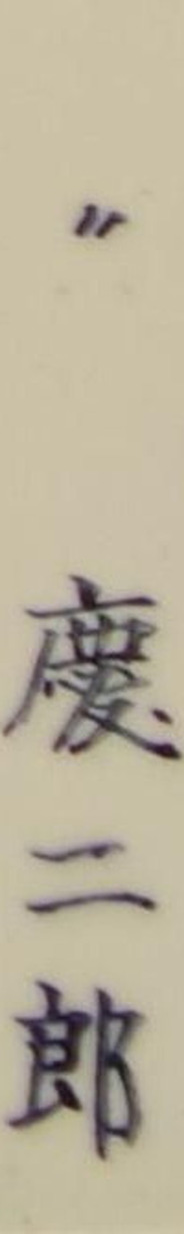慶二郎
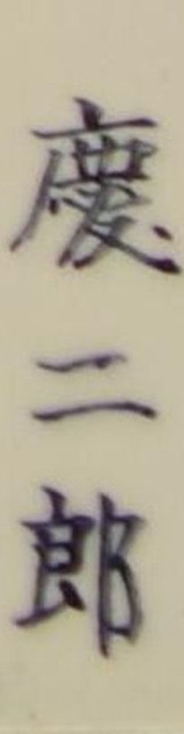慶二郎
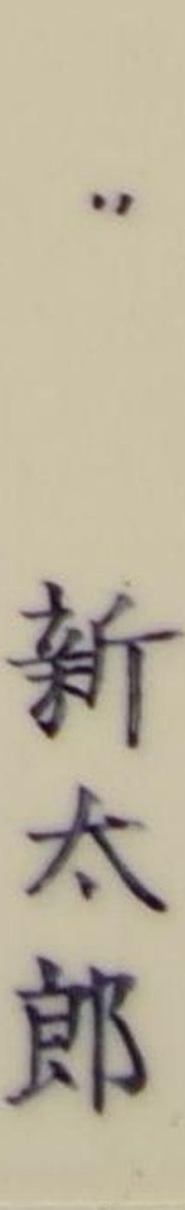新太郎
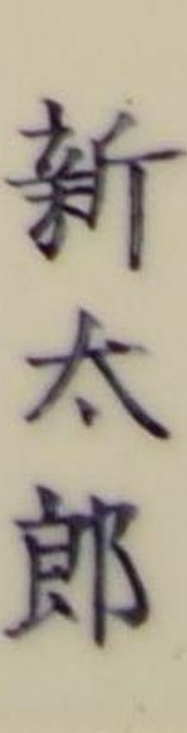新太郎
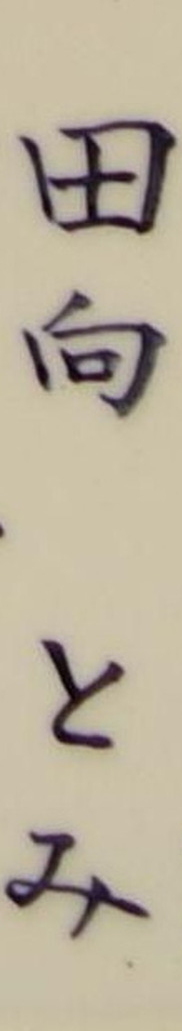田向とみ
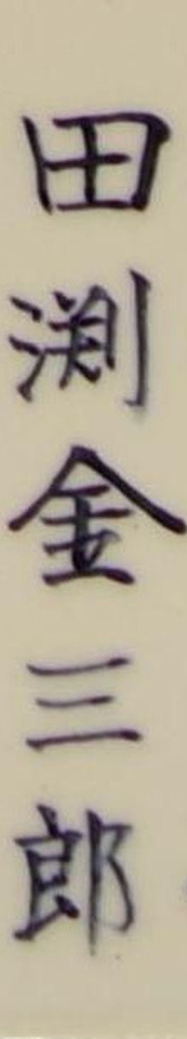田渕金三郎
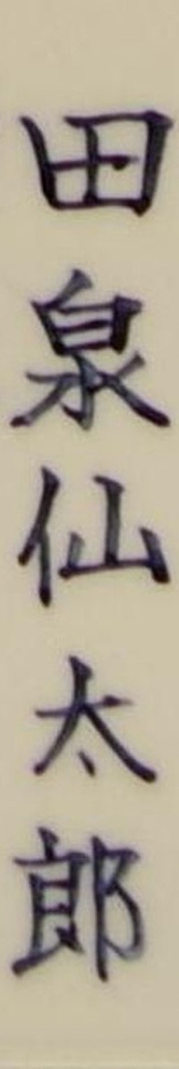田泉仙太郎
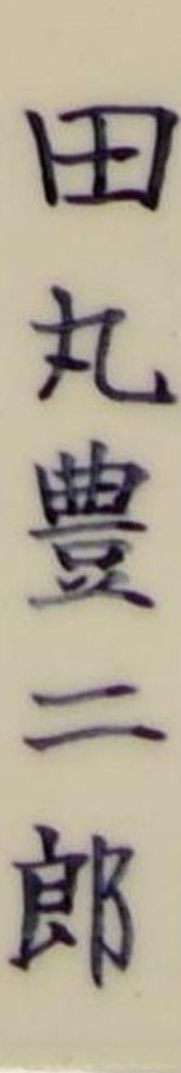田丸豊二郎
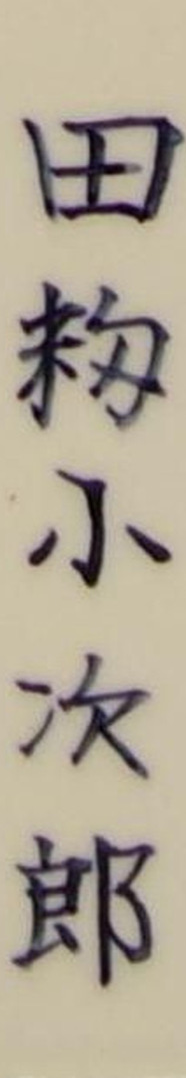田籾小次郎
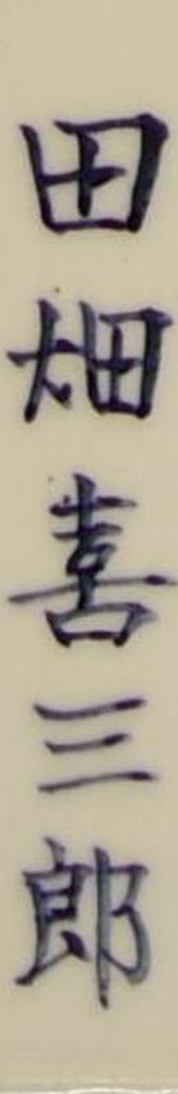田畑喜三郎
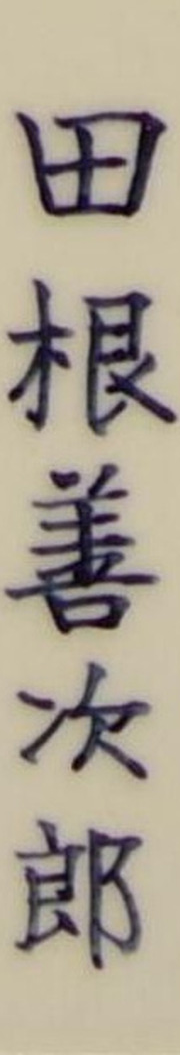田根善次郎
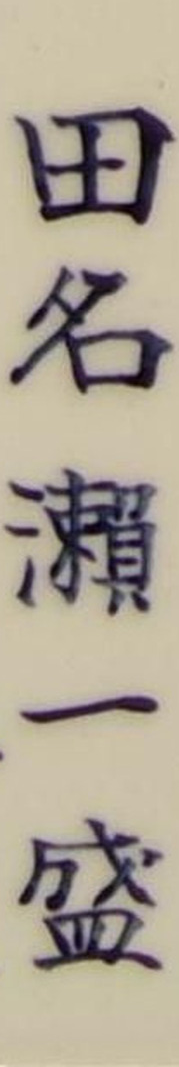田名瀬一盛
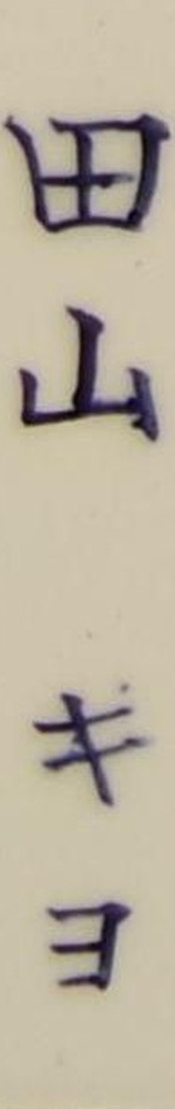田山キヨ
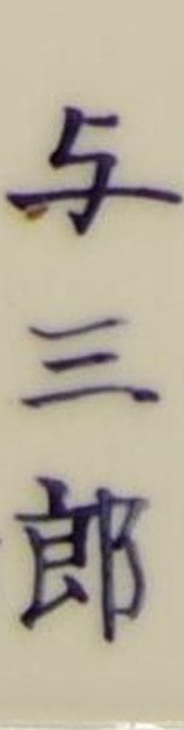与三郎
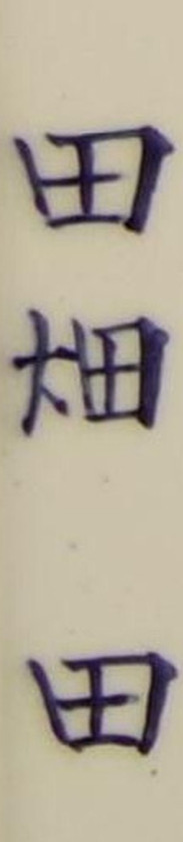田畑田

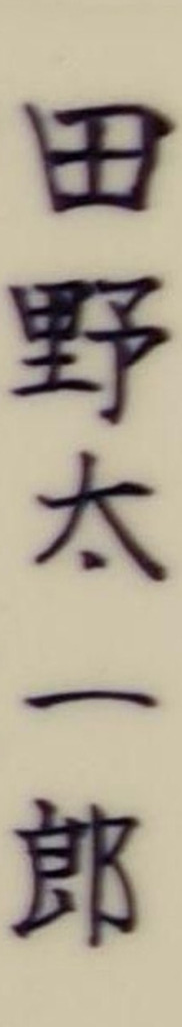田野太一郎
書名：A~D
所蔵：koyasan kongobuji
